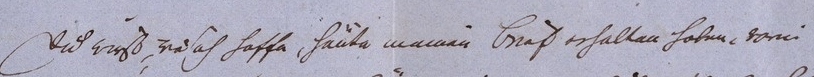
Du wirst, wie ich hoffe, heute meinen Brief erhalten haben, worin
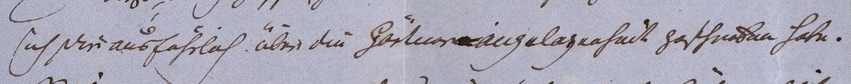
ich Dir ausführlich über die Gärtnerangelegenheit geschrieben habe.
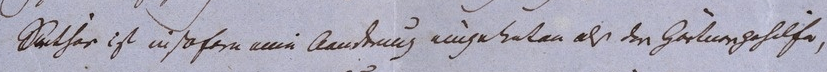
Seither ist insofern eine Aenderung eingetreten als der Gärtnergehilfe,
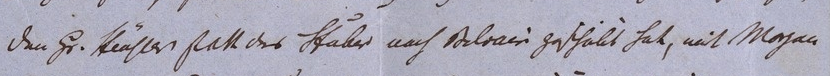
den Hr. Heusser statt des Huber nach Belvoir geschickt hat, mit Morgen
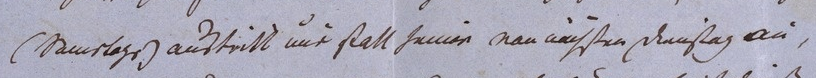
(Samstags) austritt und statt seiner von nächsten Dienstag an,
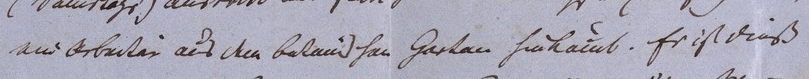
ein Arbeiter aus dem botanischen Garten herkömmt. Es ist dieß
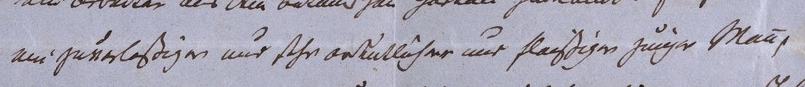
ein zuverläßiger und sehr ordentlicher und fleißiger junger Mann,
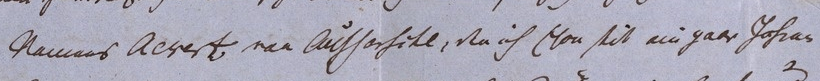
Namens Ackert von Aussersihl, den ich schon seit ein paar Jahren
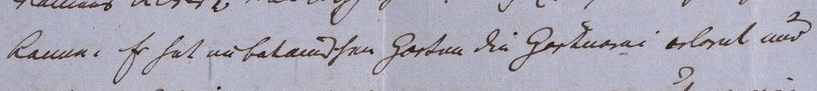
kenne. Er hat im botanischen Garten die Gärtnerei erlernt und
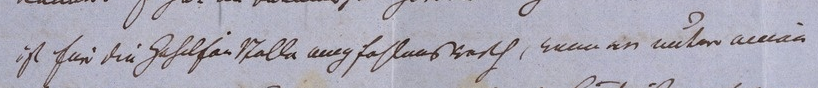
ist für die Gehilfenstelle empfehlenswerth, wenn er unter einen
